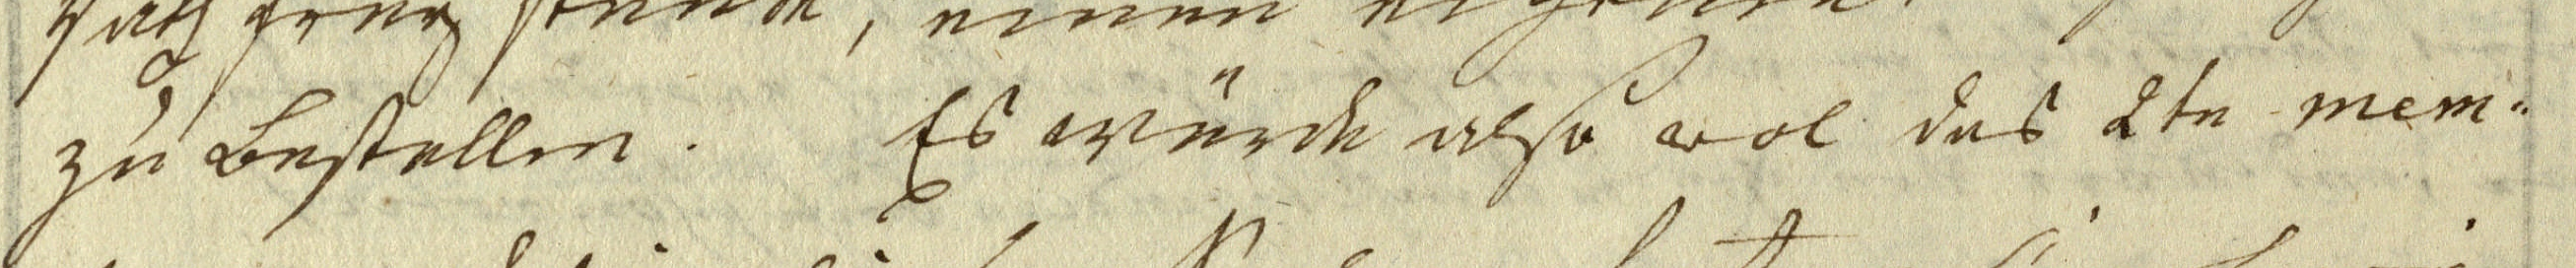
zu bestellen. Es würde also wohl das 2te mem¬
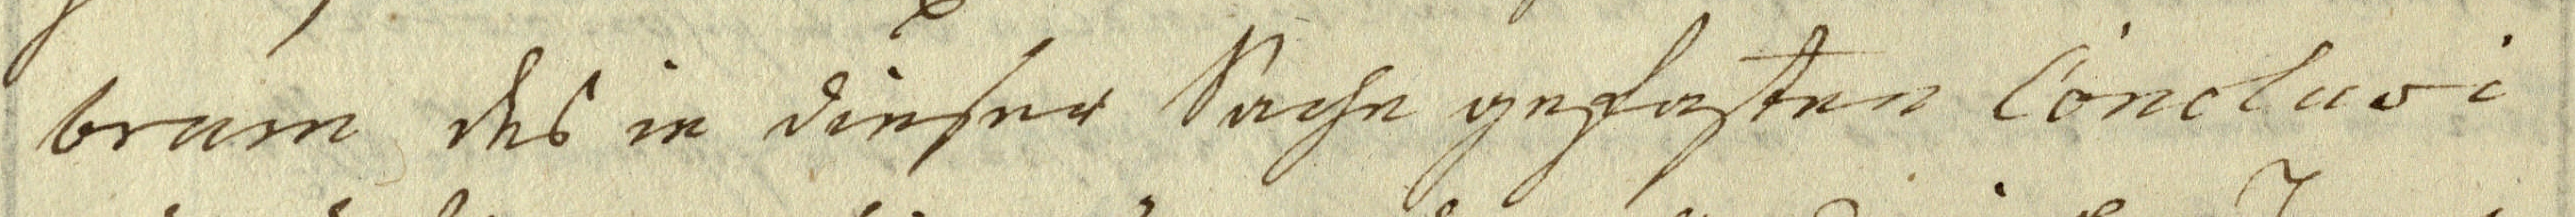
brum des in dieser Sache gefasten Conclusi
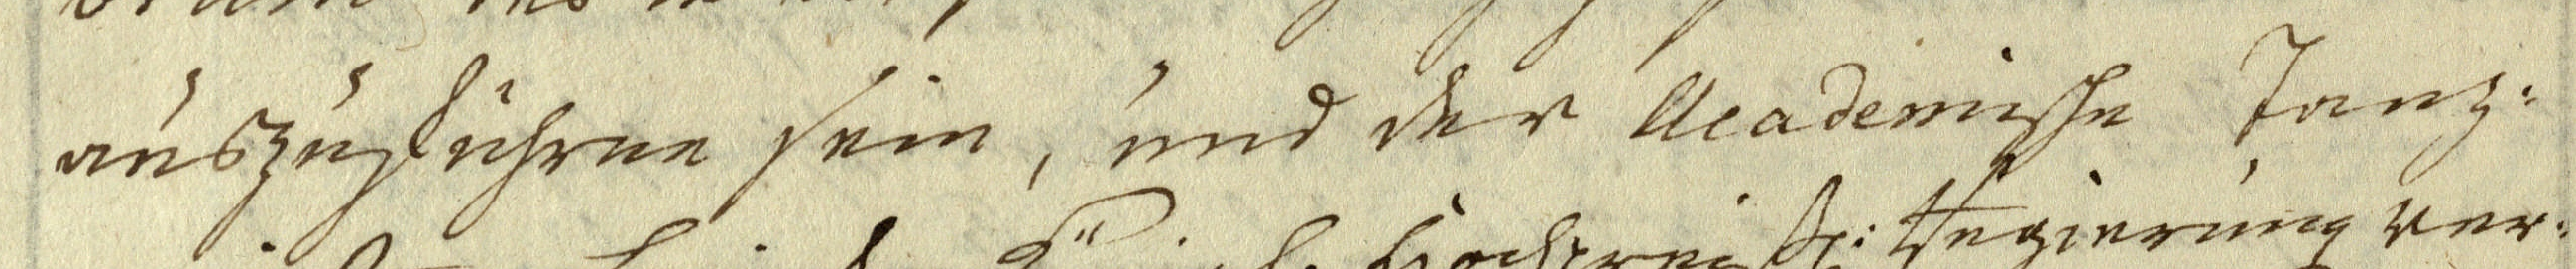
auszuführen sein, und der Academische Tanz¬
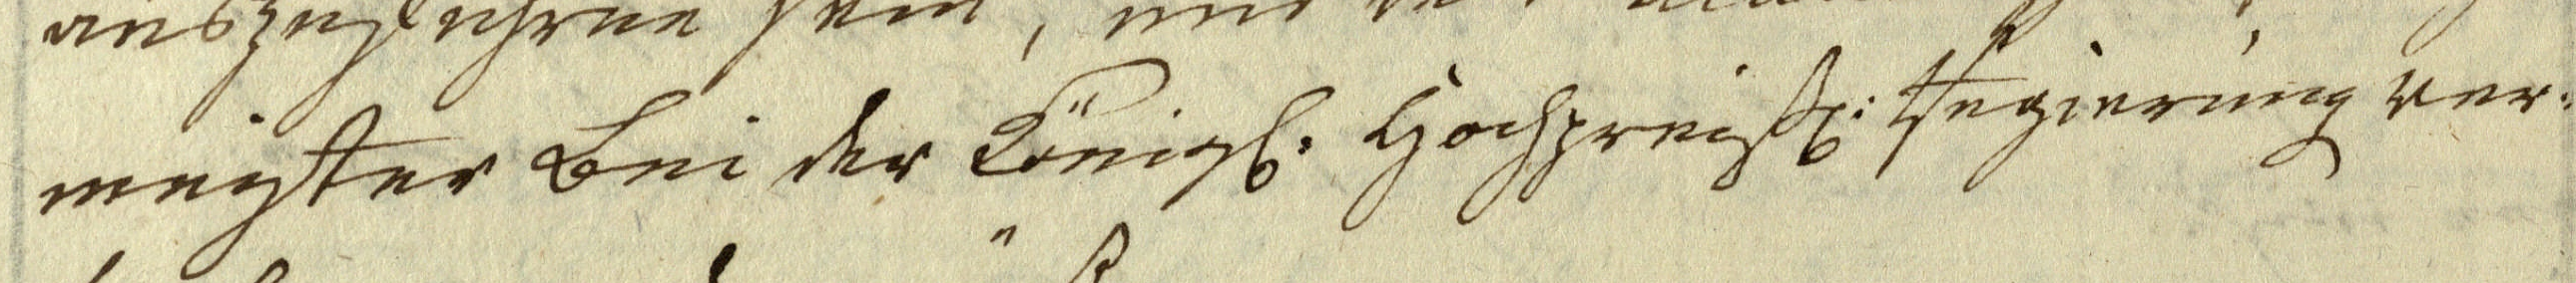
meister bei der Königl. Hochpreißl: Regierung ver¬
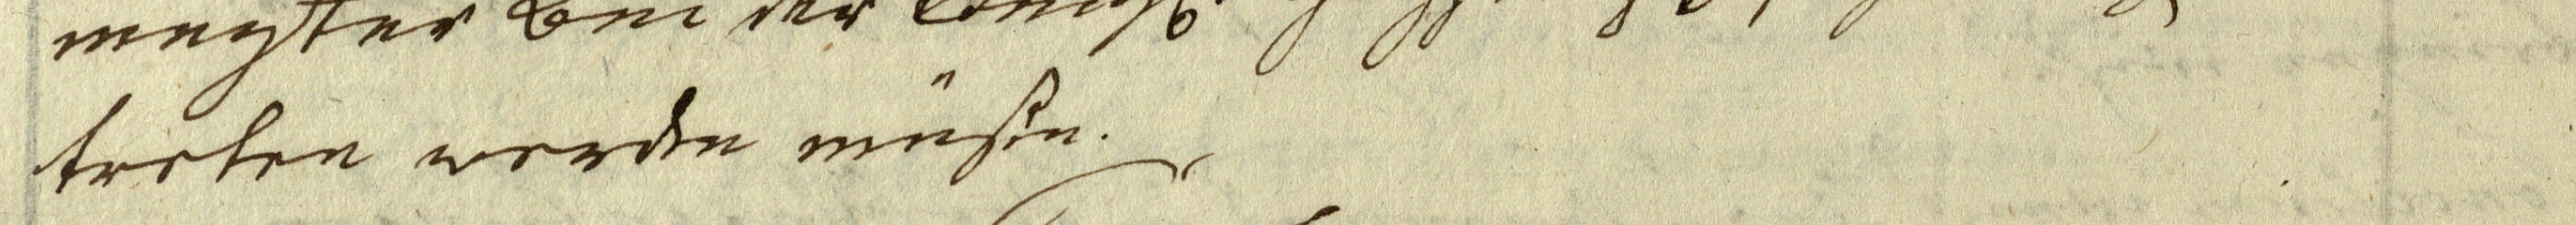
treten werden müßen.
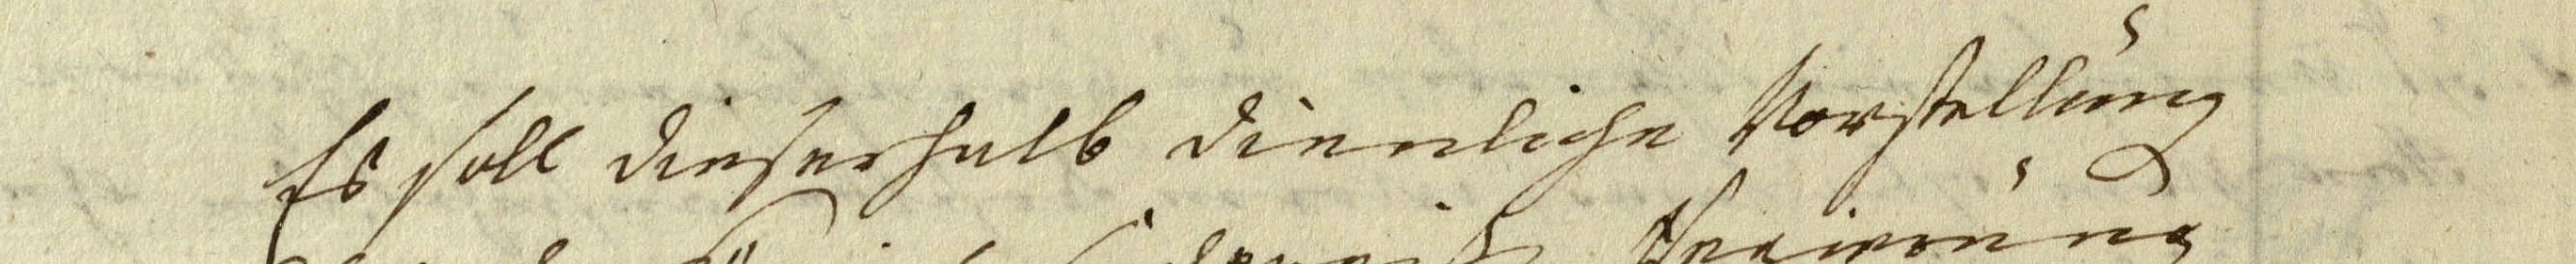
Es soll dieserhalb dienliche Vorstellung
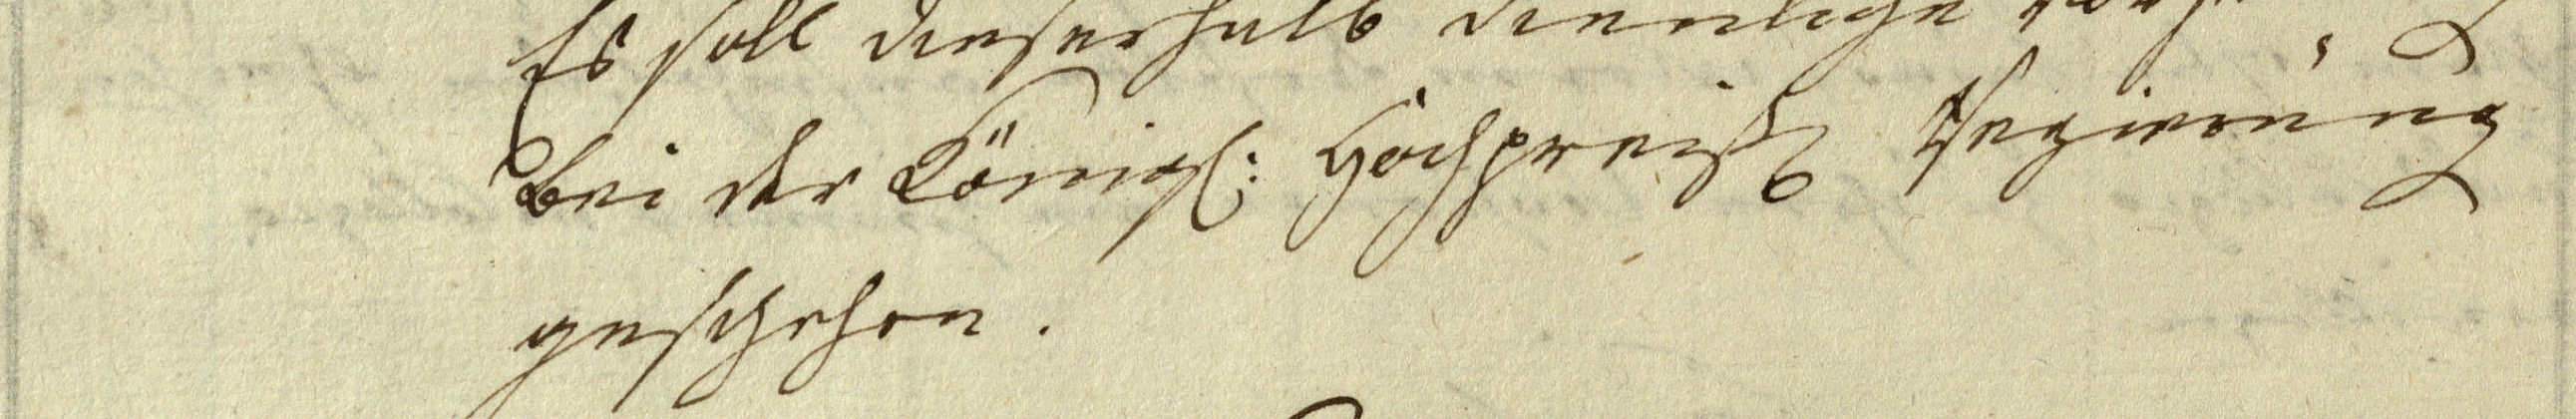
bei der Königl. Hochpreißl Regierung
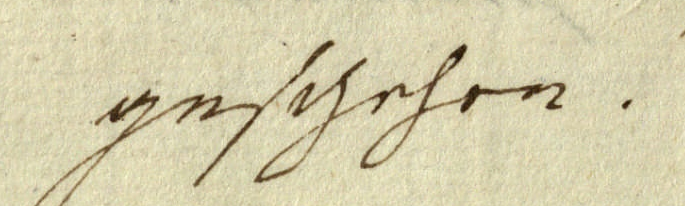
geschehen.
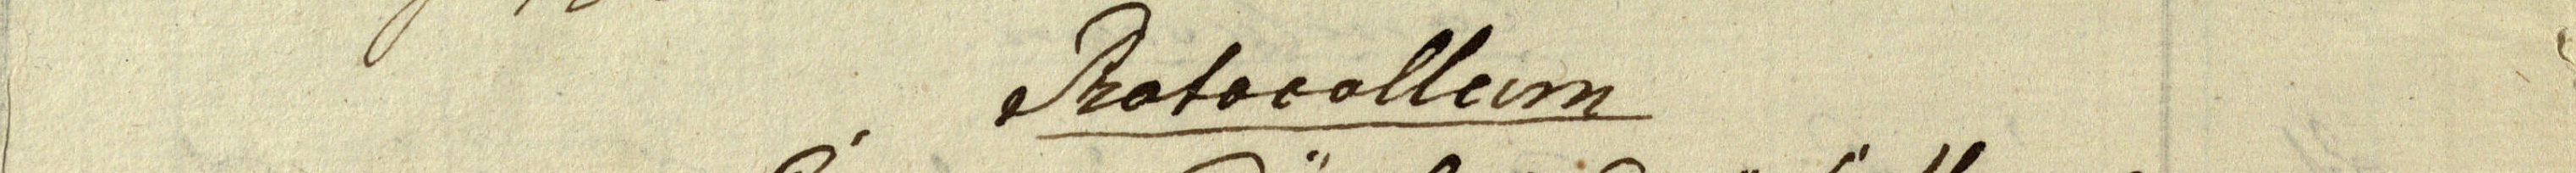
Protocollum
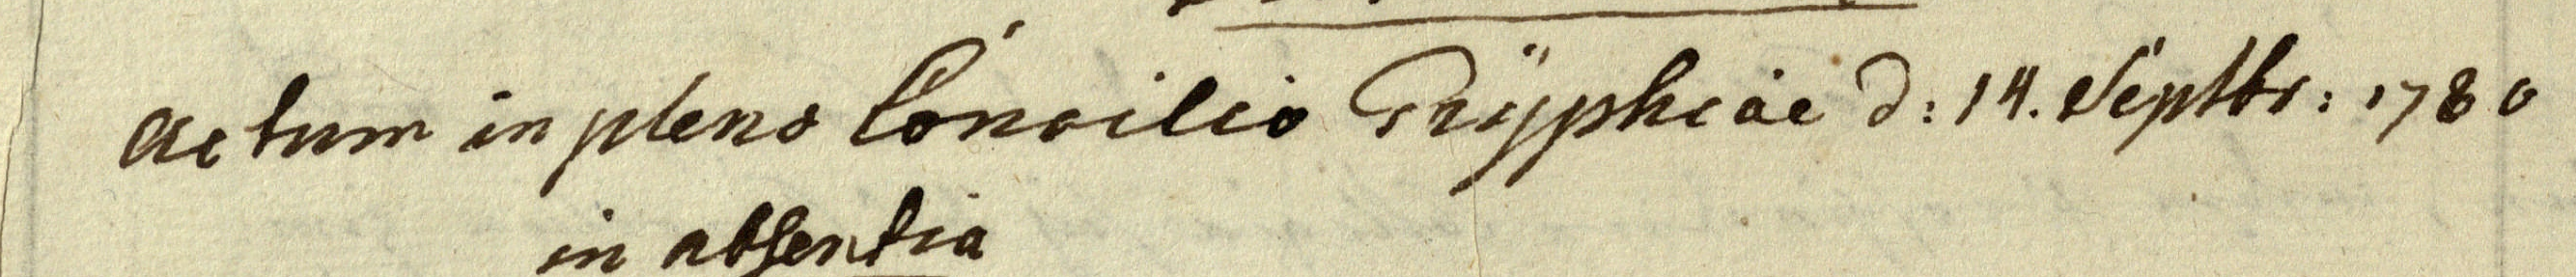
Actum in pleno Concilio Grÿphiae d. 14. Septbr: 1780
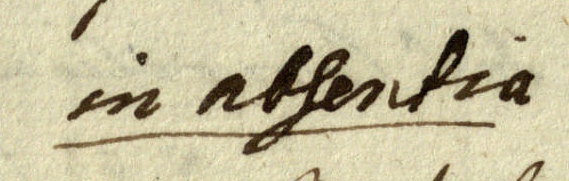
in absentia
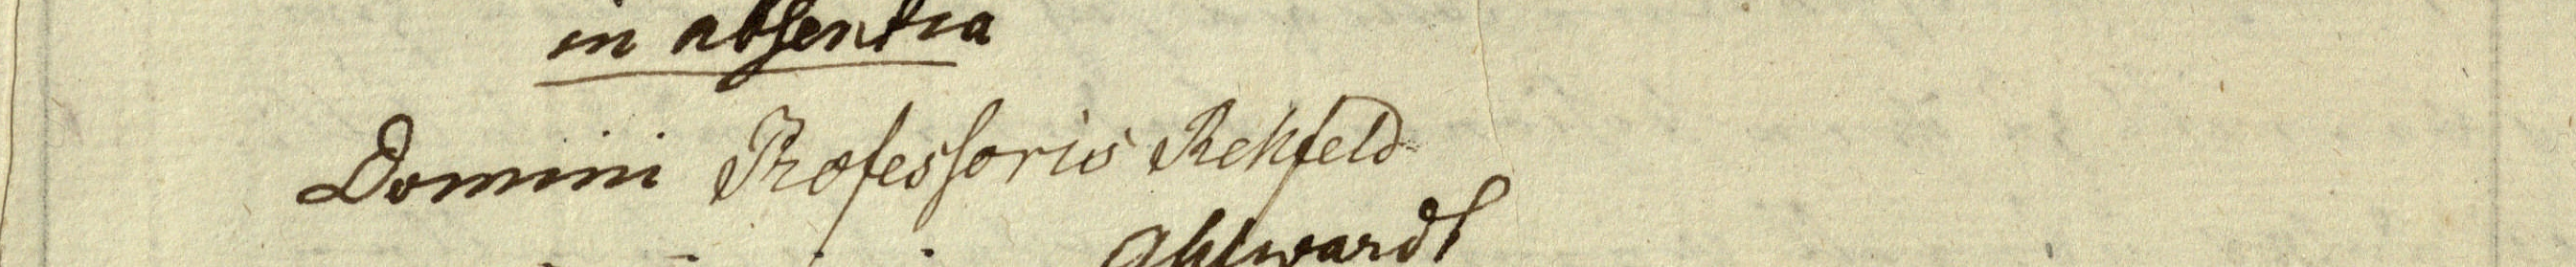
Domini Professoris Rehfeld
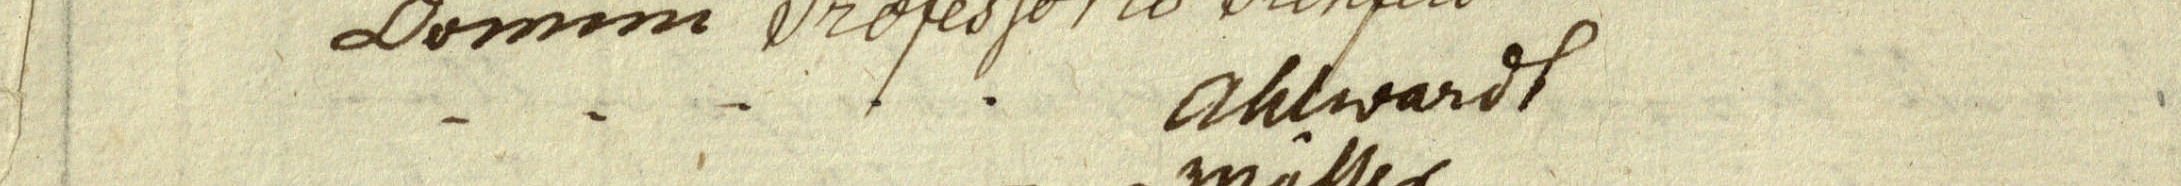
Ahlwardt
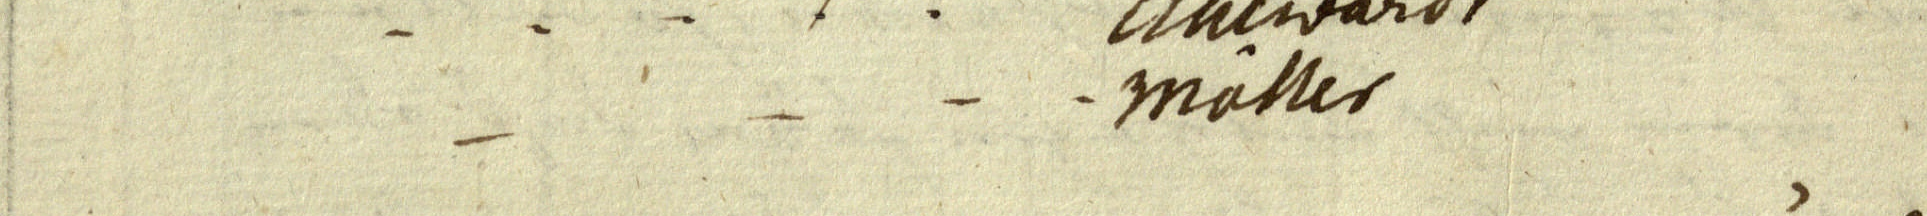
Möller
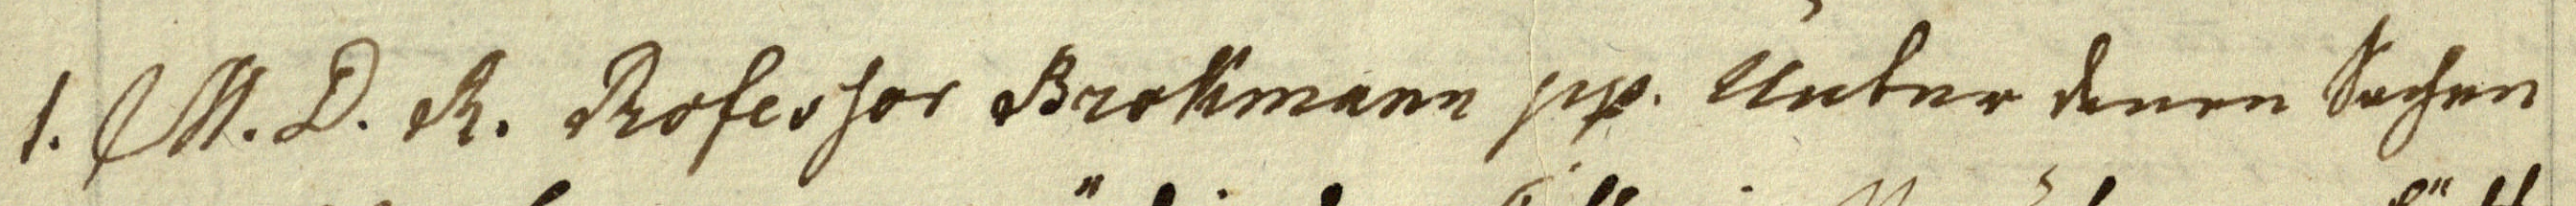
1. M. D. R. Professor Brokmann pp. Unter denen Sachen
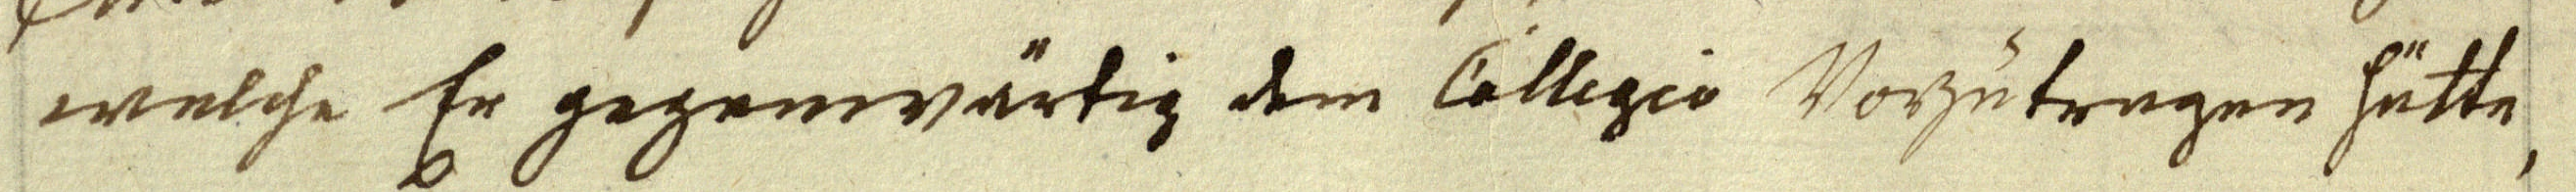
welche Er gegenwärtig dem Collegio vorzutragen hätte,
